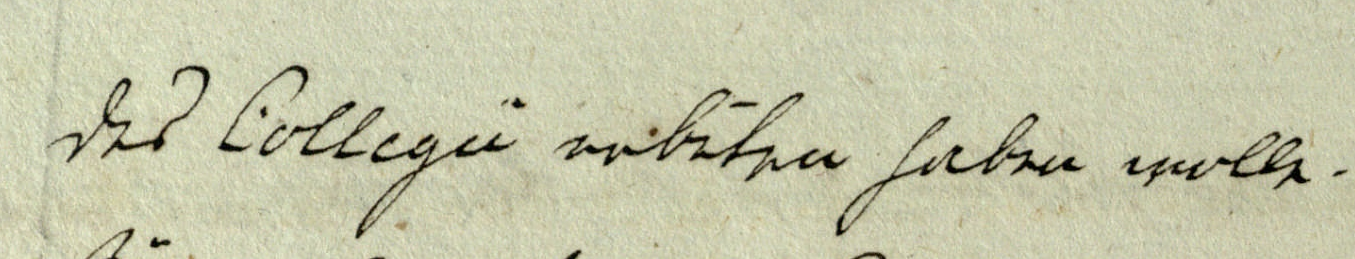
des Collegii erbeten haben wolle.
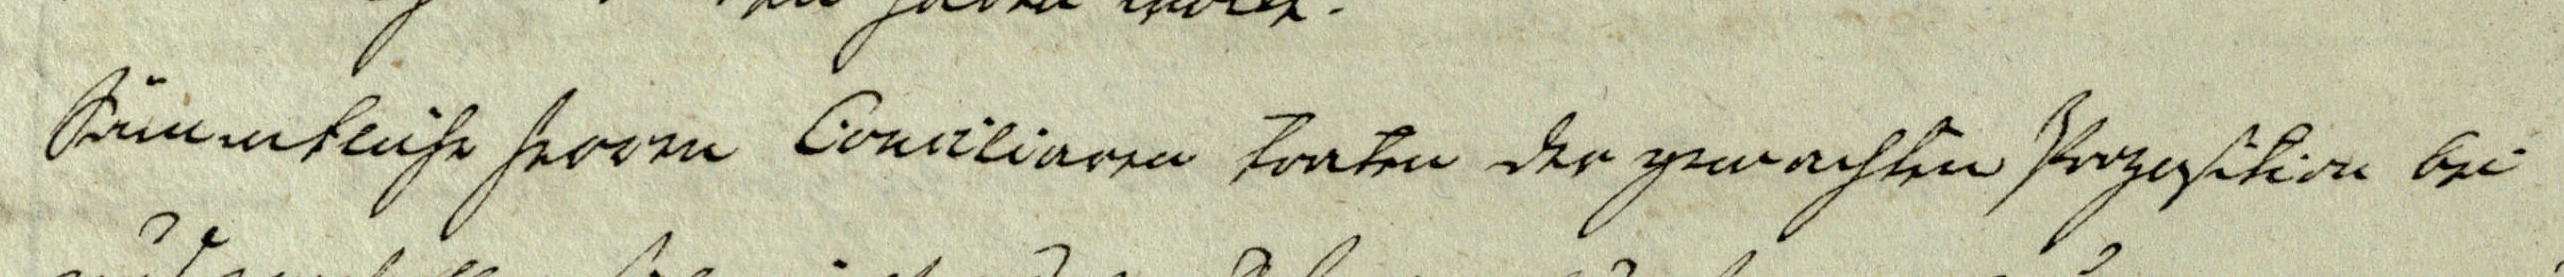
Sämmtliche Herren Conciliaren traten der gemachten Proposition bei
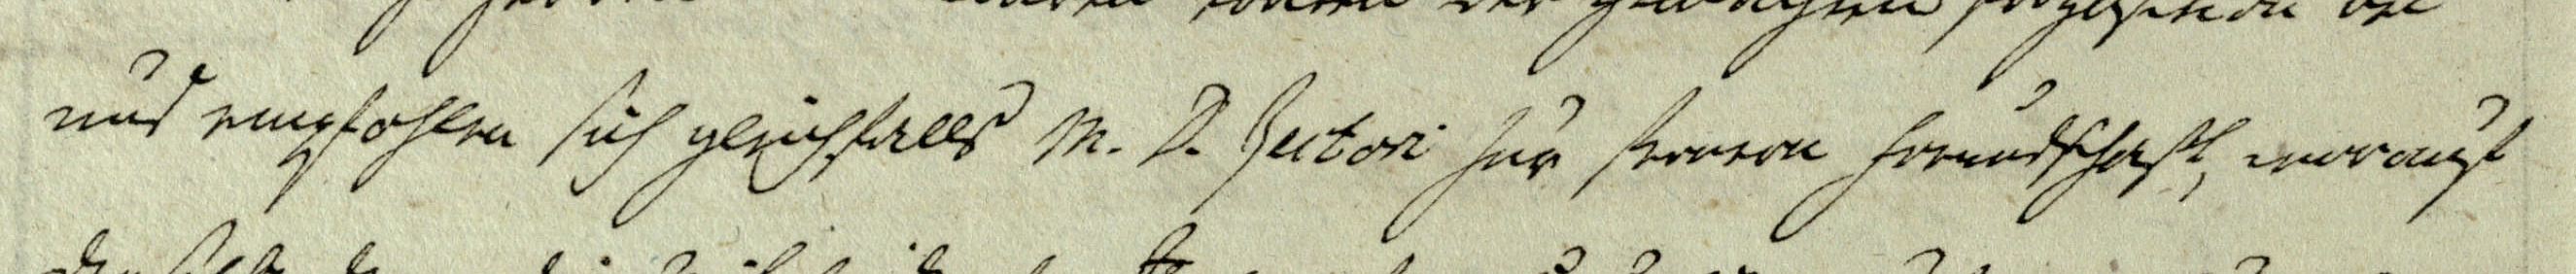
und empfohlen sich gleichfalls M. D. Rectore zur fernern Freundschaft, worauf
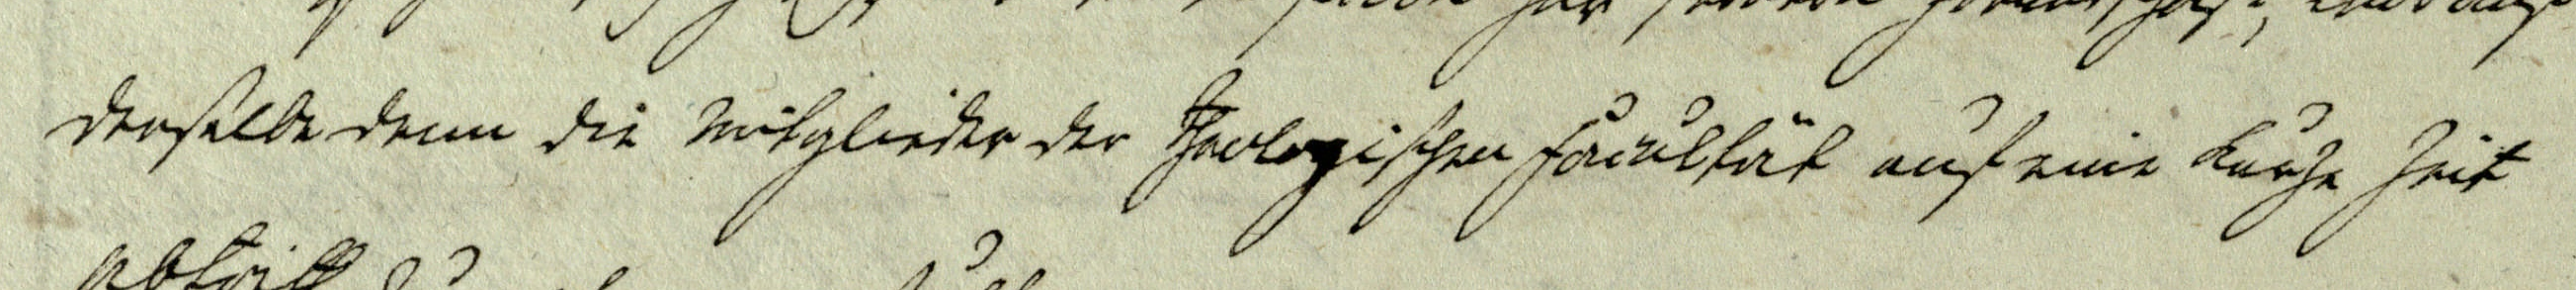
derselbe denn die Mitglieder der Theologischen Facultät auf eine kuze Zeit
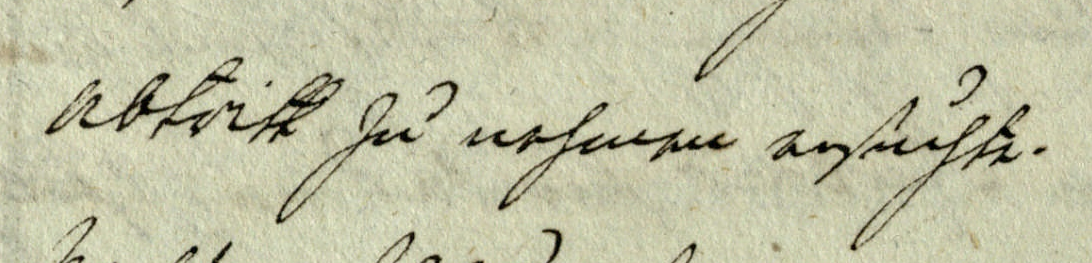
Abtritt zu nehmen ersuchte.
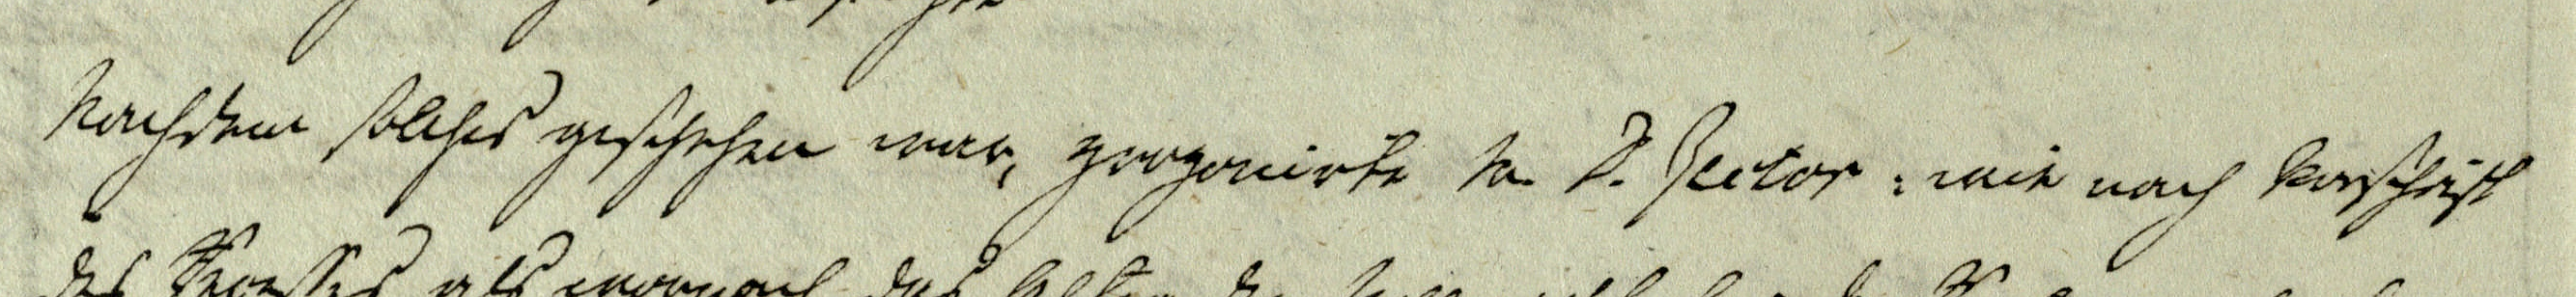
Nachdem solches geschehen war, proponirte M D. Rector: wie nach Vorschrift
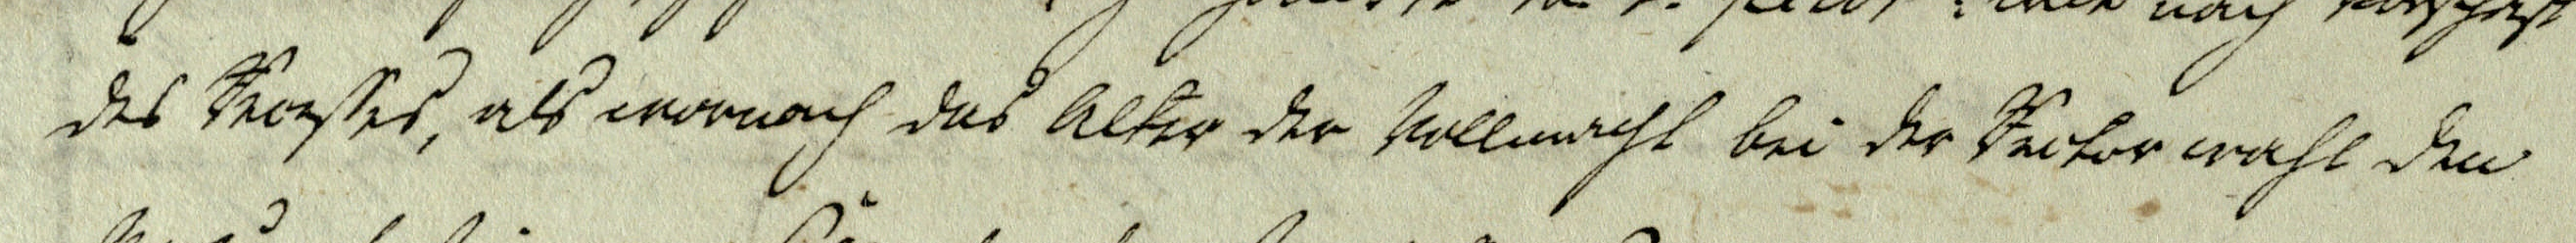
des Recesses, als wornach das Alter der Vollmacht bei der Rectorwahl den
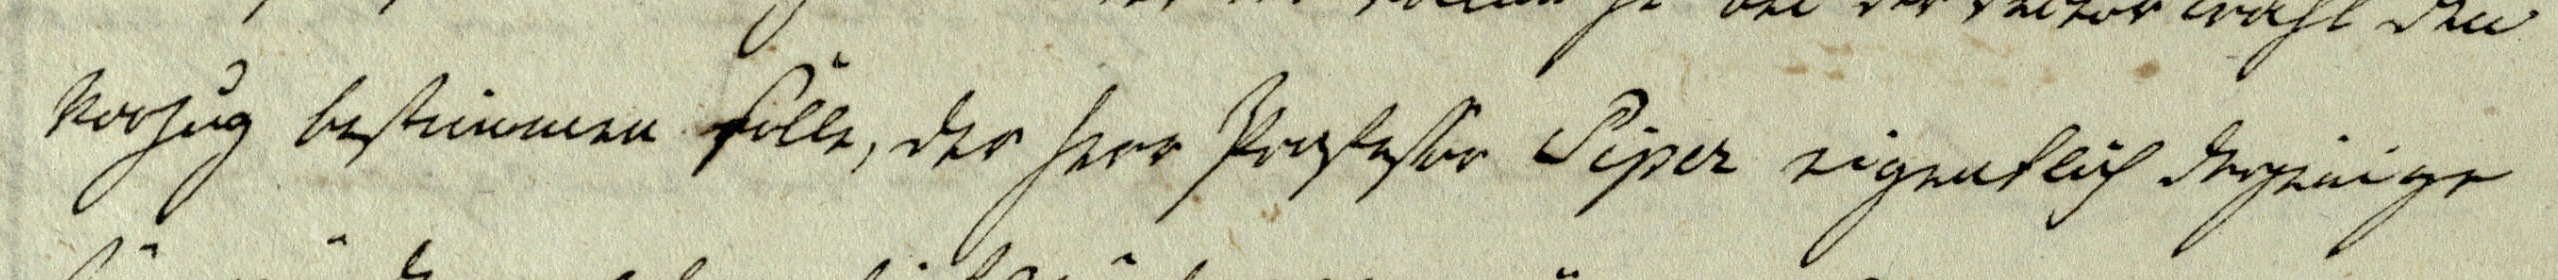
Vorzug bestimmen solle, der Herr Professor Piper eigentlich derjenige
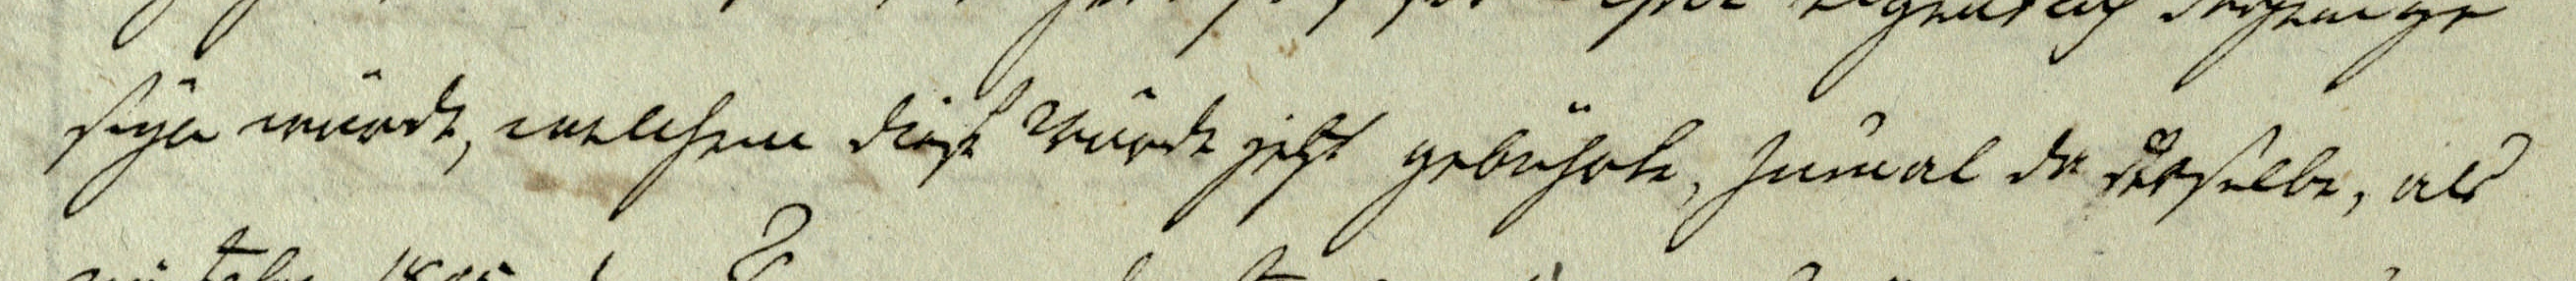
seÿn würde, welchem diese Würde jetzt gebührte, zumal da derselbe, als
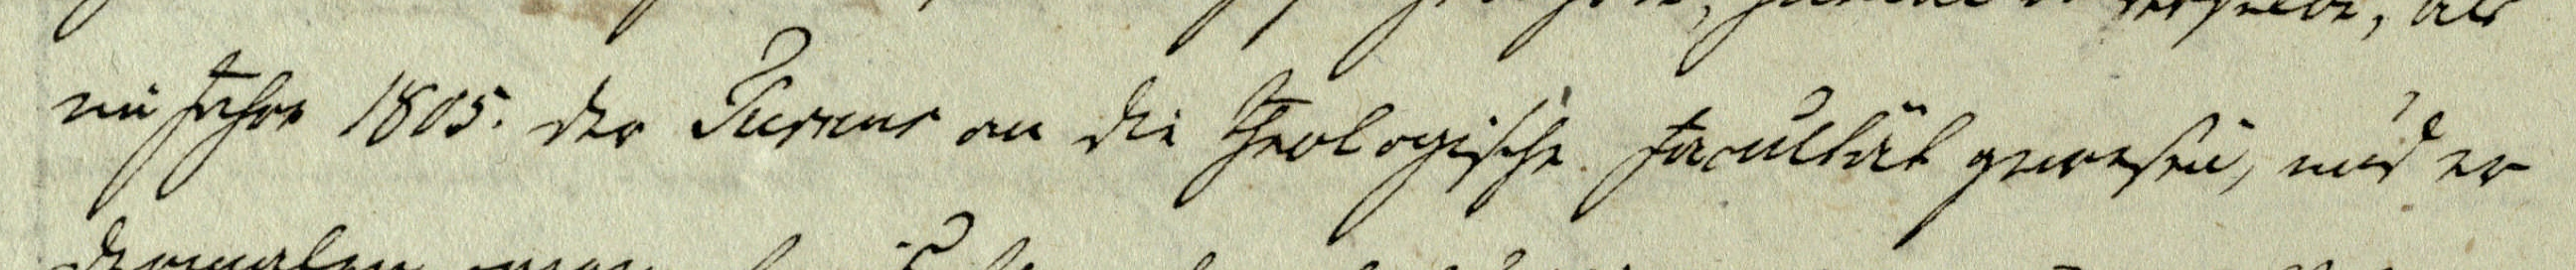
im Jahre 1805. der Turnus an die Theologische. Facultät gewesen, und er
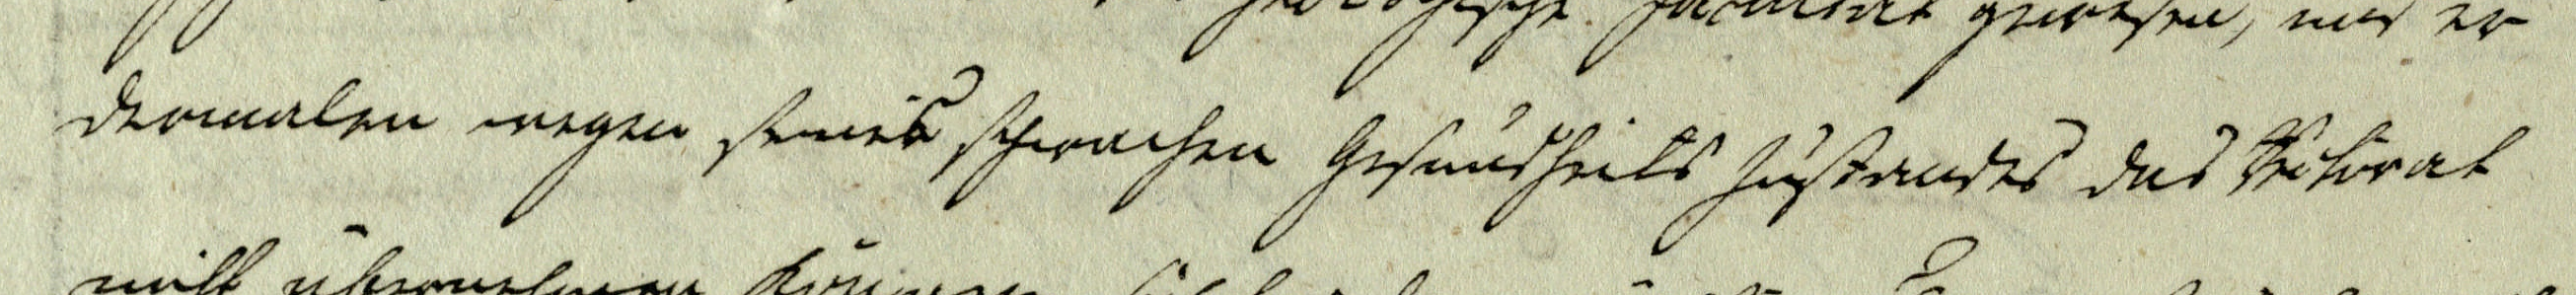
dermalen wegen seines schwachen Gesundheitszustandes das Rectorat
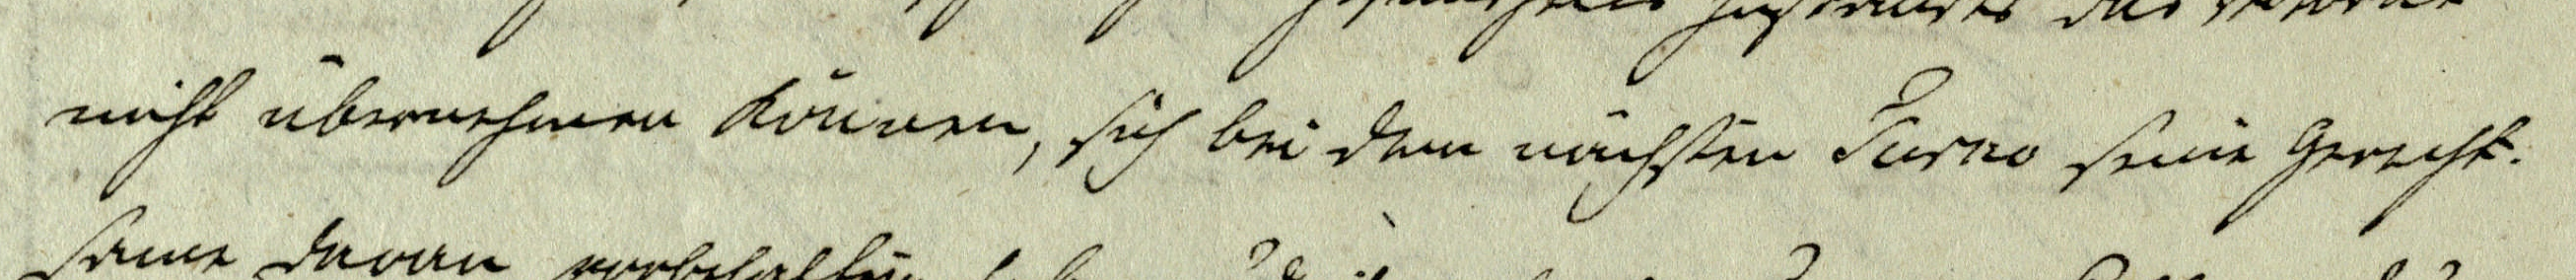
nicht übernehmen können, sich bei dem nächsten Turno seine Gerecht¬
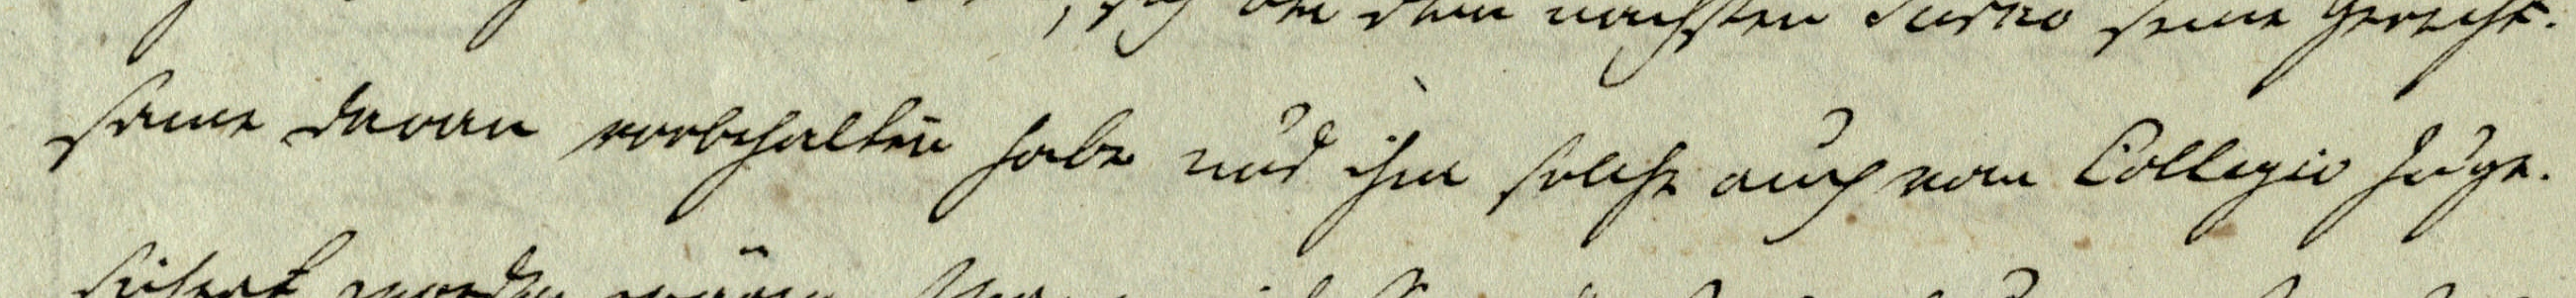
same daran vorbehalten habe und ihm solche auch vom Collegio zuge¬
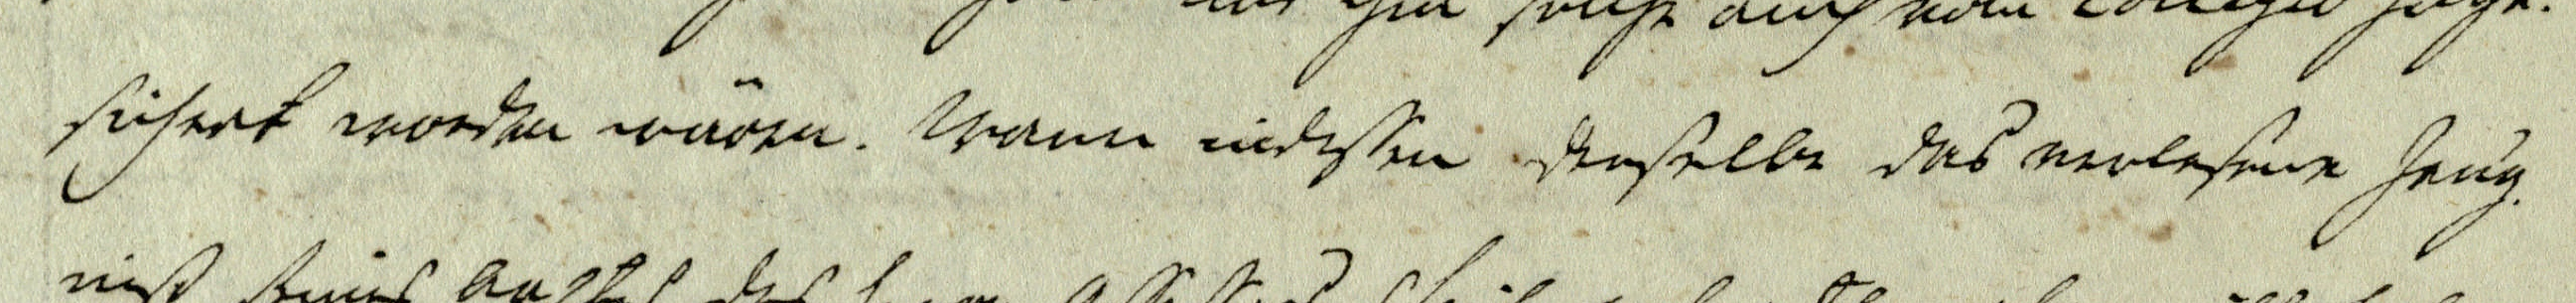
sichert worden wären. Wann indessen derselbe das verlesene Zeug¬
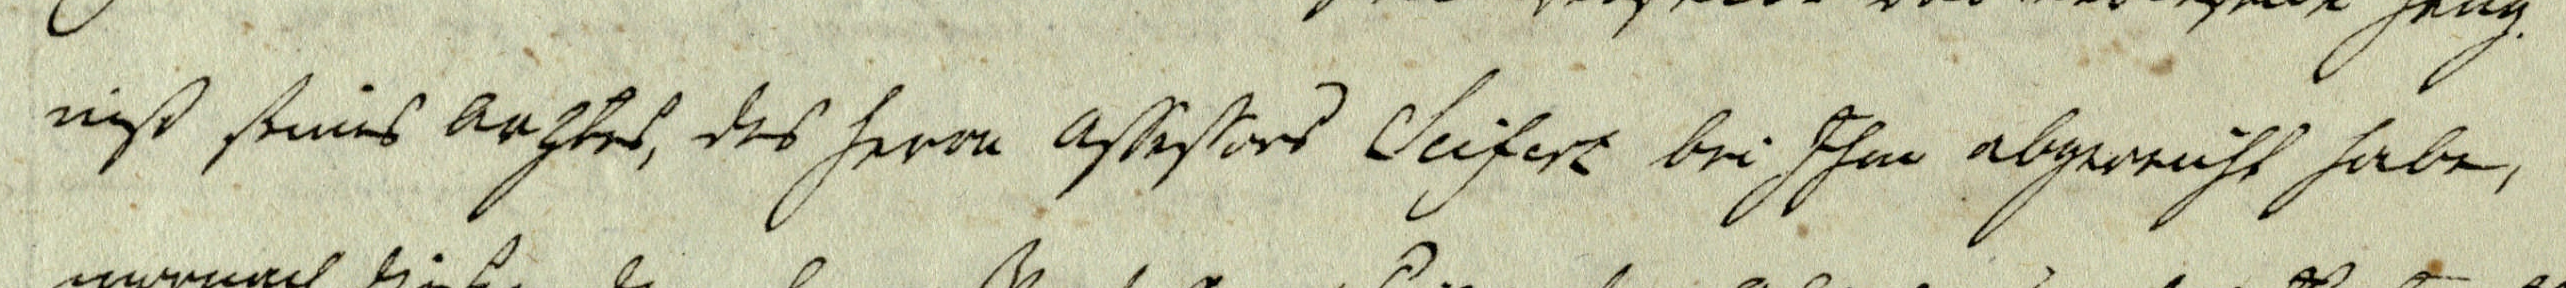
niß seines Arztes, des Herrn Assessors Seifert bei Ihm abgereicht habe,
